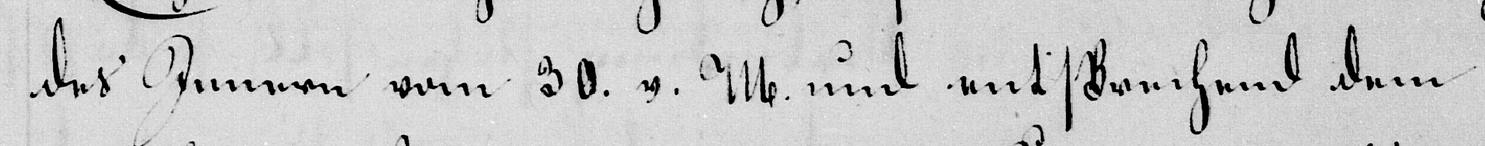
des Innern vom 30. v. M. und entsprechend dem
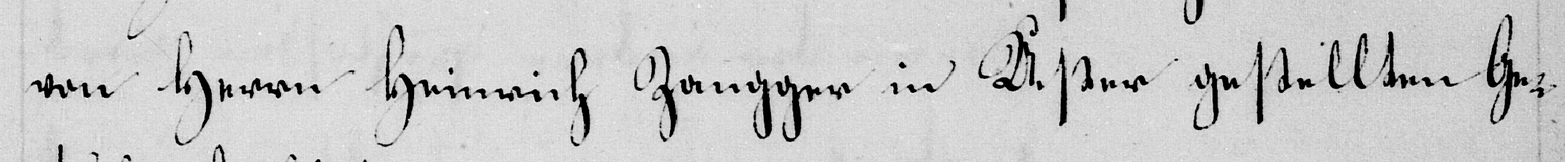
von Herrn Heinrich Zangger in Uster gestellten Ge¬
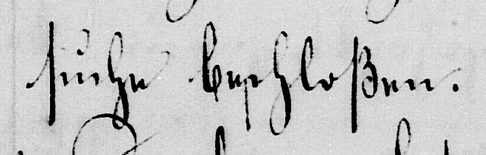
suche beschloßen:
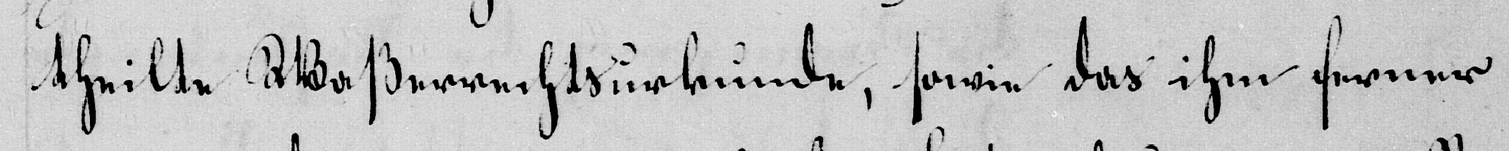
theilte Waßerrechtsurkunde, sowie das ihm ferner
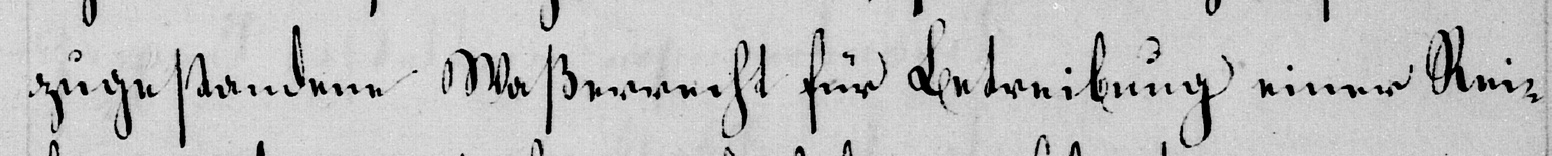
zugestandene Waßerrecht für Betreibung einer Rei¬
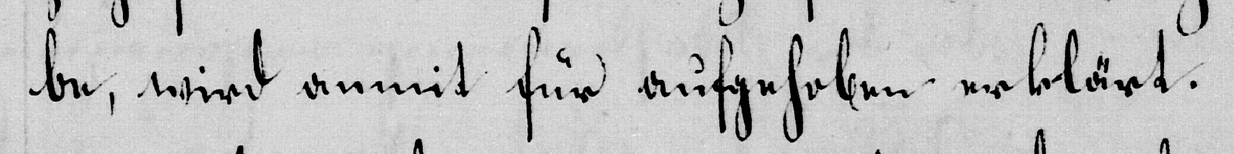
be, wird anmit für aufgehoben erklärt.
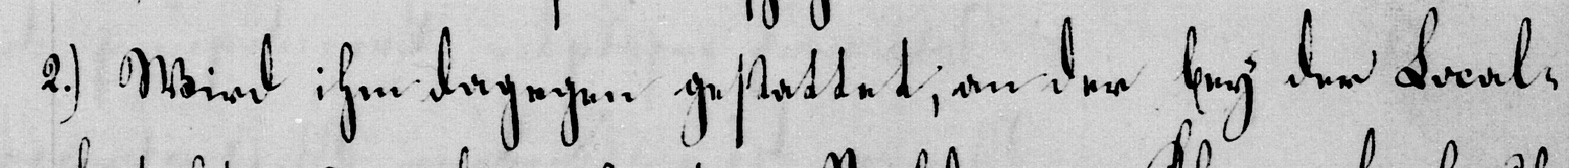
2.) Wird ihm dagegen gestattet, an der bey der Local¬
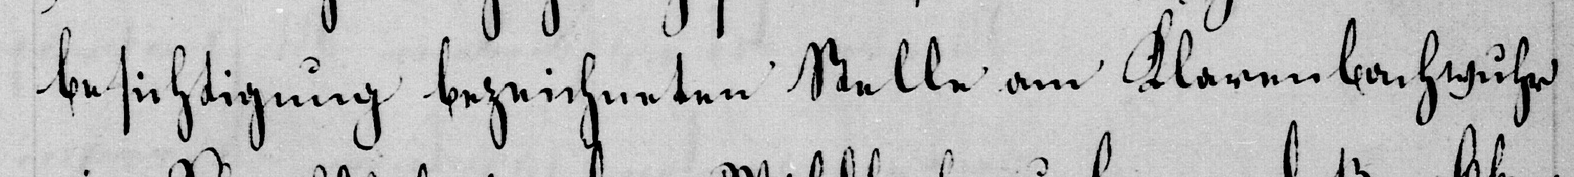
besichtigung bezeichneten Stelle am Klarenbachwuhr
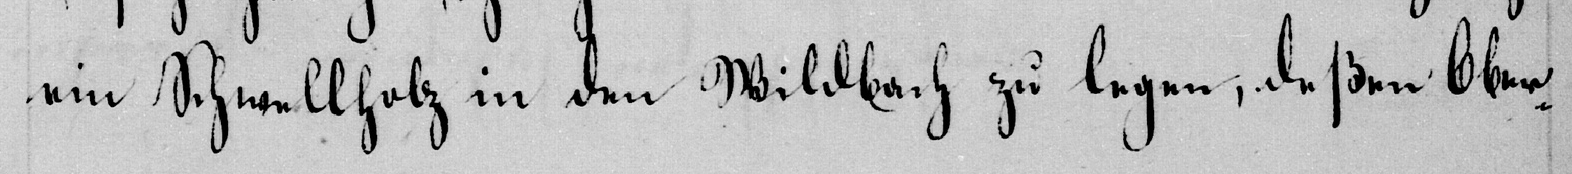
ein Schwellholz in den Wildbach zu legen, deßen Ober-
